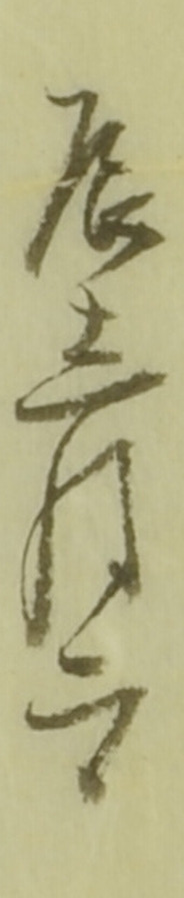辰十二月二日
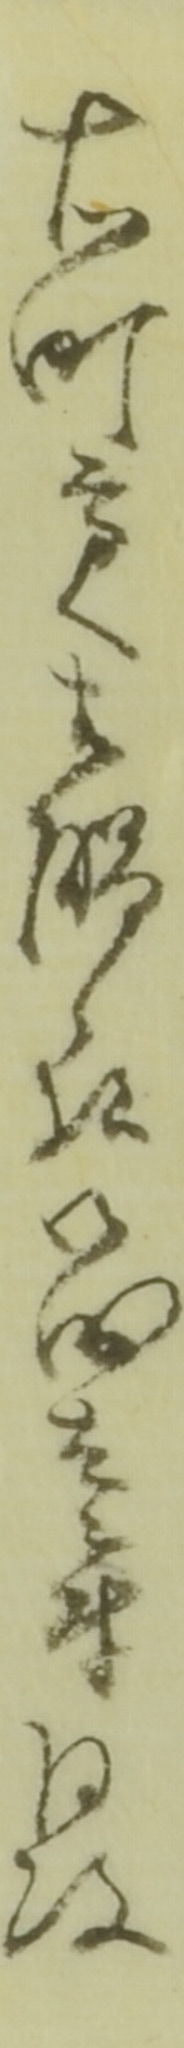右町定相触候様御助者ニ付同役
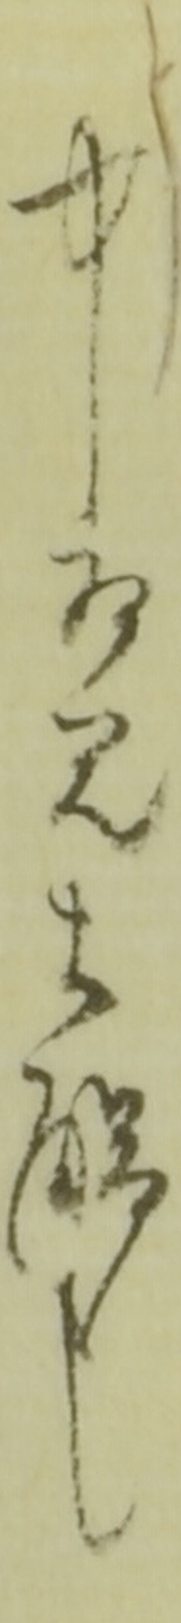中為見相触申候

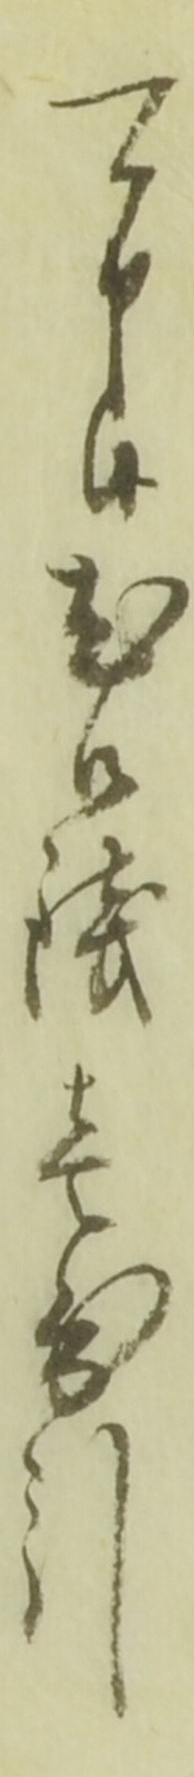可申候尤口銭壱分引
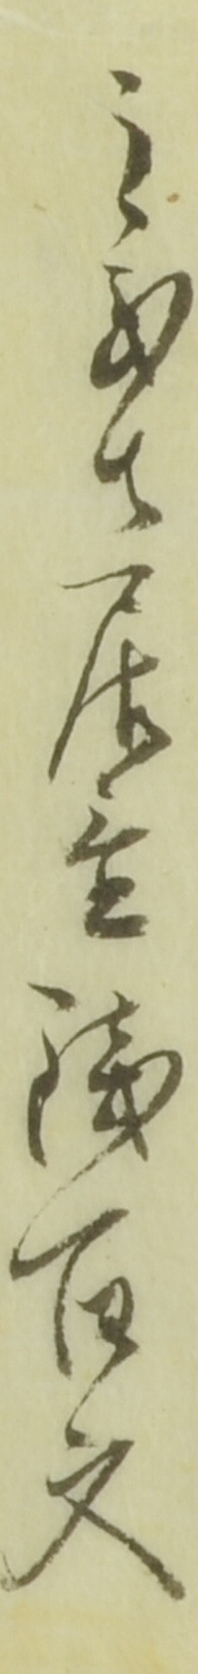之義者居置銭百文
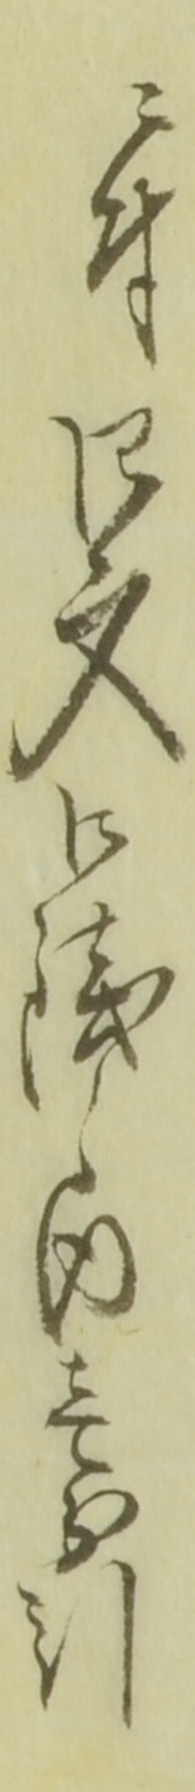ニ付四文口銭之内壱分引
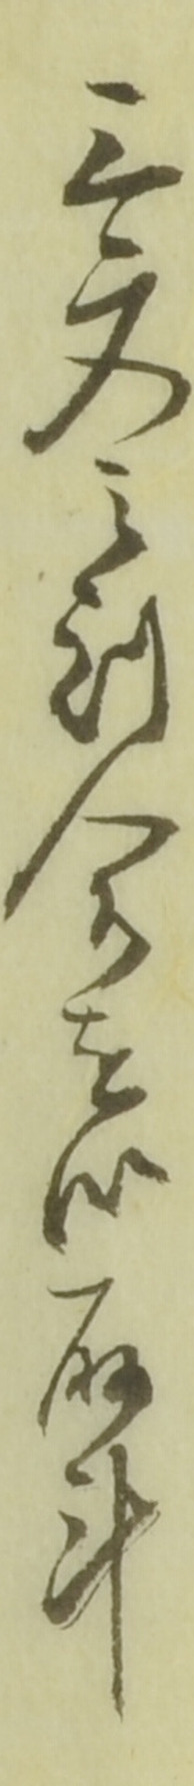三文之割合を以取斗
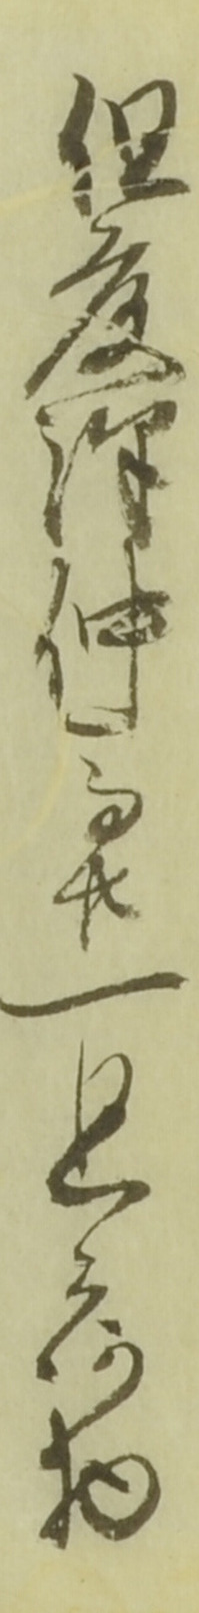但藤沢仲馬共一旦荷物
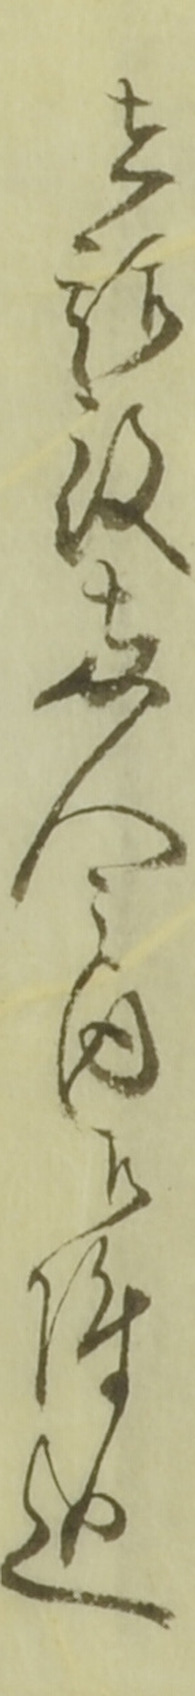世話役両人之内候附込
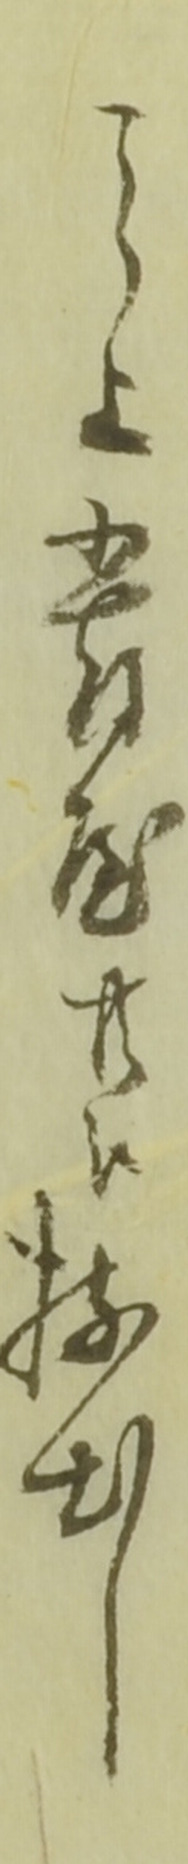之上肴屋共江持出し
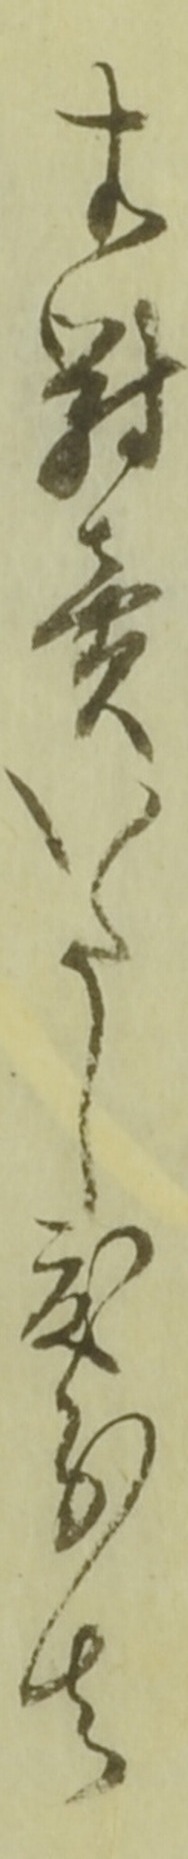相対売いたし度分者
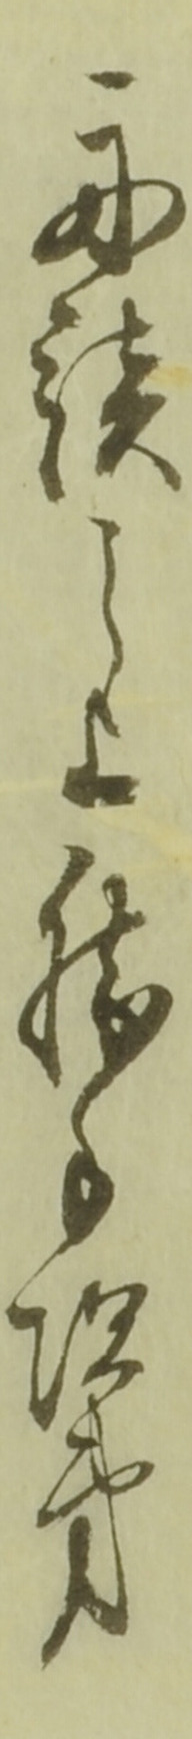永続之上勝手次第
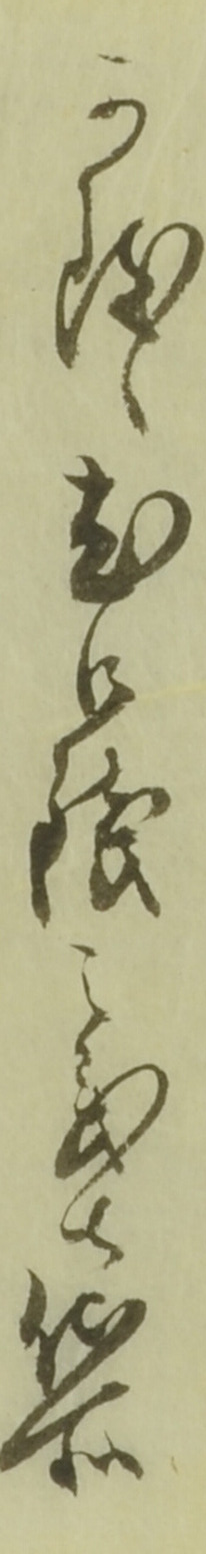可致候尤口銭之義者他所
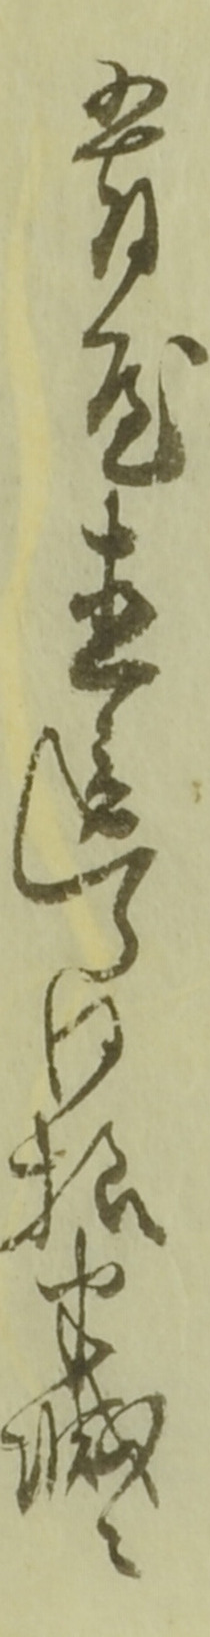肴屋直送り同様半減ニ
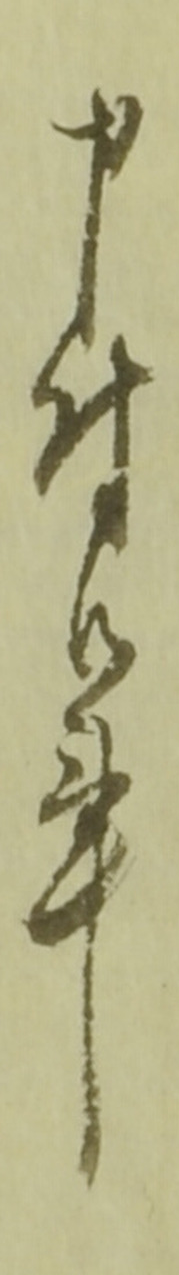申付候事
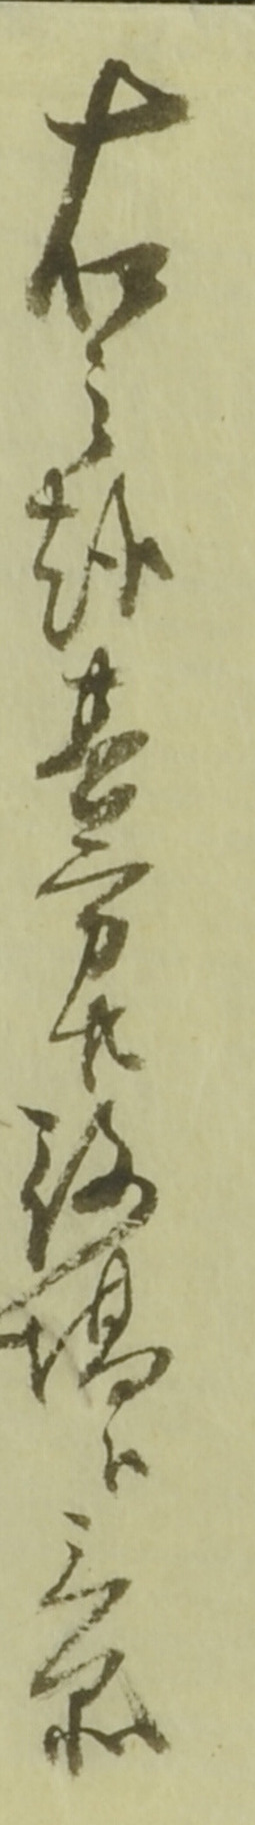右之趣其方共役場江三品
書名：御触書御書附控
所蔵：伊那市立高遠町図書館・合同会社AMANE
